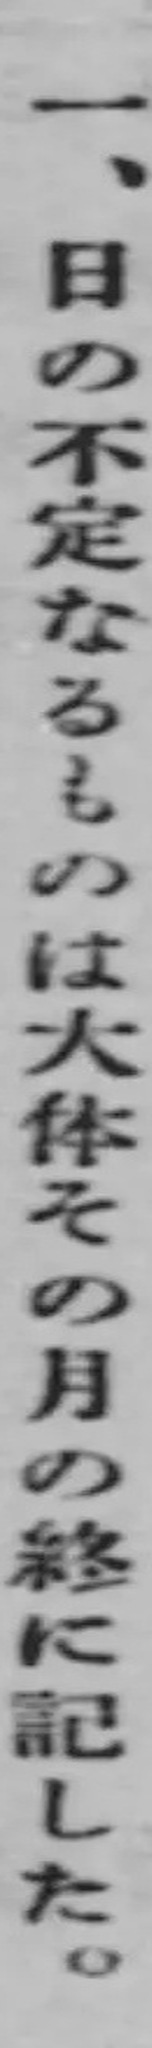一、日の不定なるものは大体その月の終に記した。
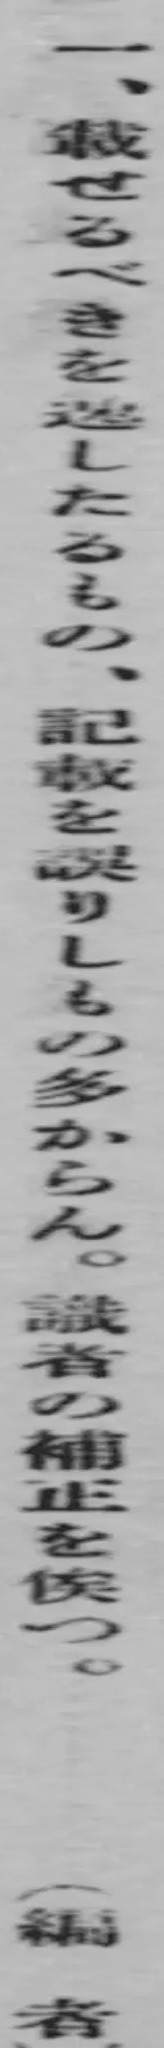一、載せるべきを逸したるもの、記載を誤りしもの多からん。識者の補正を俟つ。(編者)
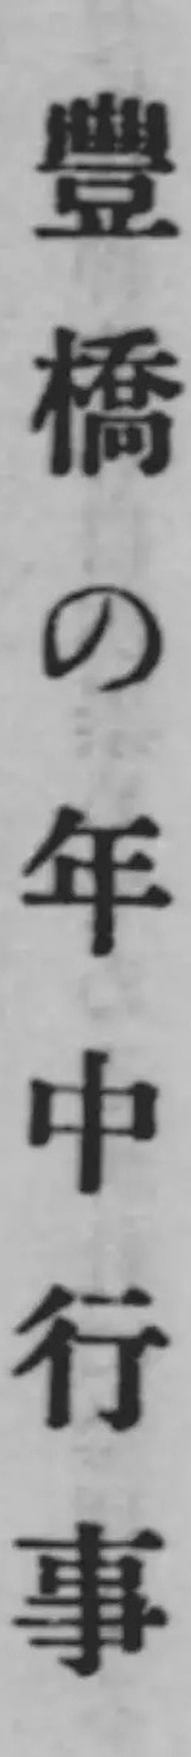豐橋の年中行事
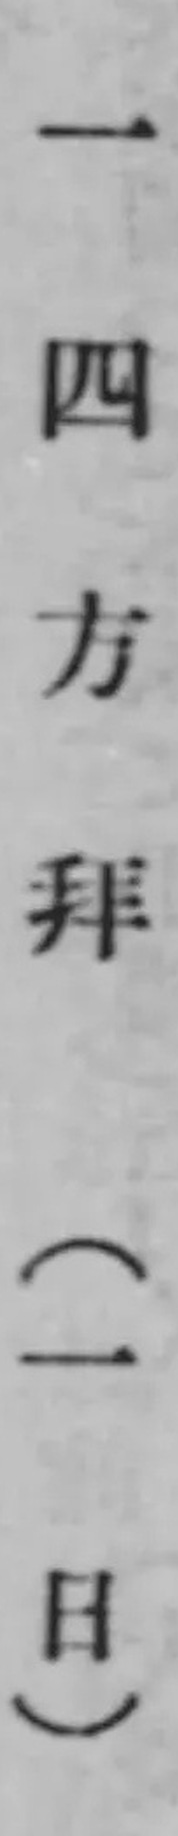一四方拜(一日)
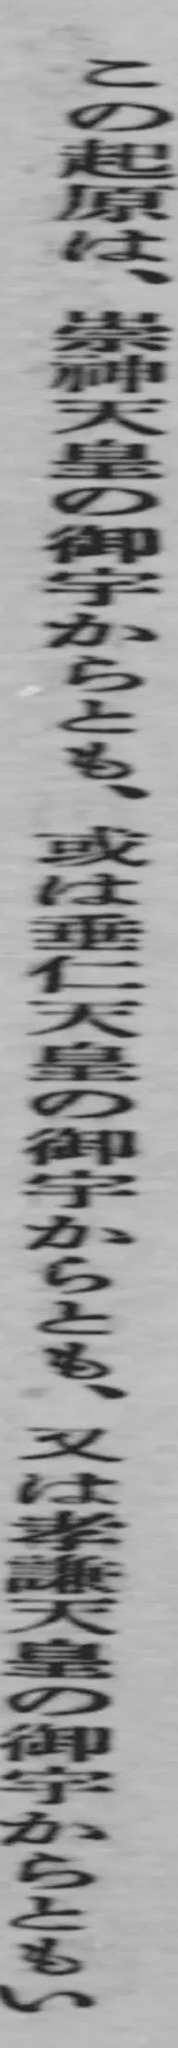この起原は、崇神天皇の御宇からとも、或は垂仁天皇の御宇からとも、又は孝謙天皇の御宇からともい
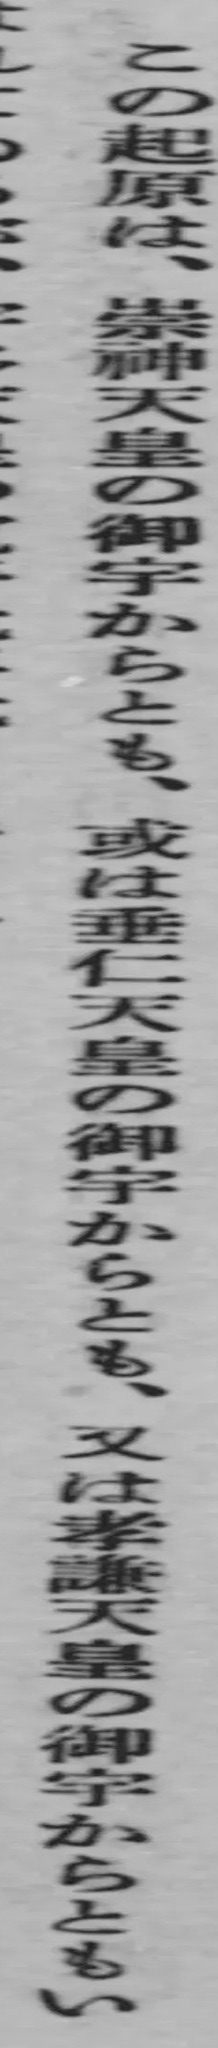この起原は、崇神天皇の御宇からとも、或は垂仁天皇の御宇からとも、又は孝謙天皇の御宇からともい
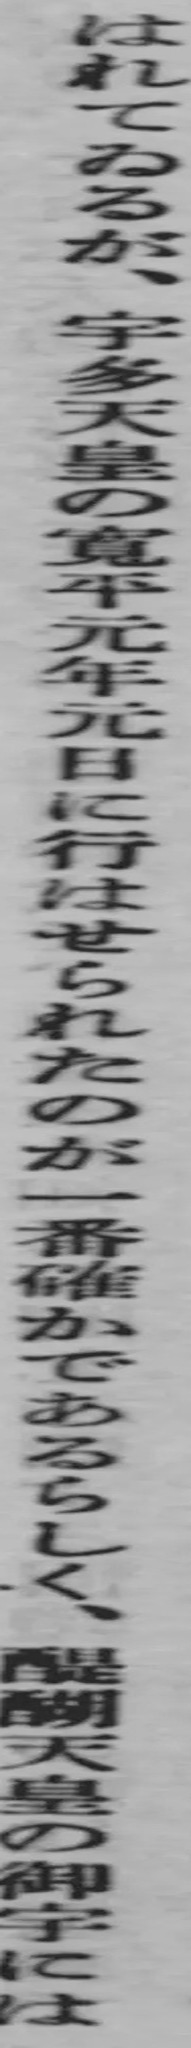はれてゐるが、宇多天皇の寛平元年元日に行はせられたのが一番確かであるらしく、醍醐天皇の御宇には
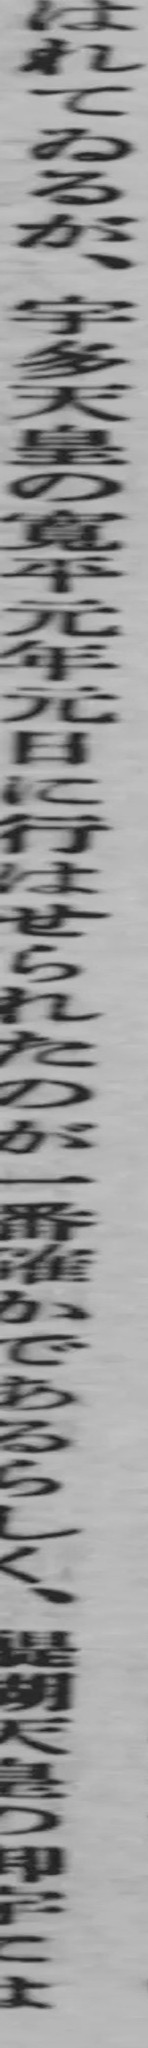はれてゐるが、宇多天皇の寛平元年元日に行はせられたのが一番確かであるらしく、醍醐天皇の御宇には
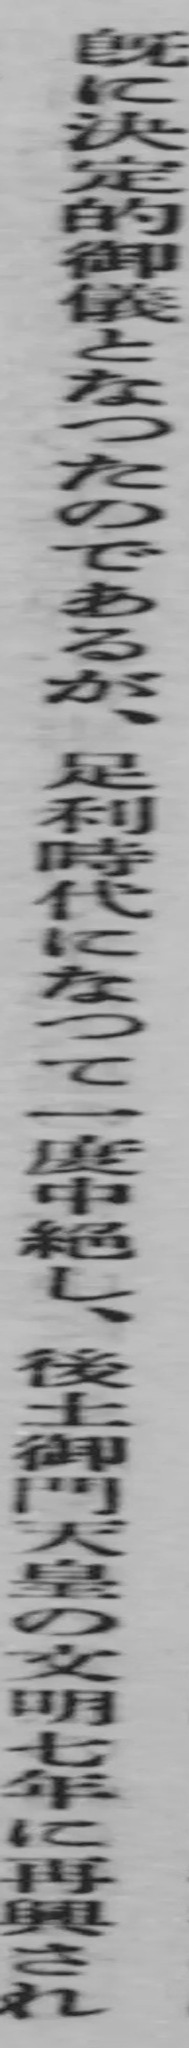旣に決定的御儀となつたのであるが、足利時代になつて一度中絕し、後土御門天皇の文明七年に再興され
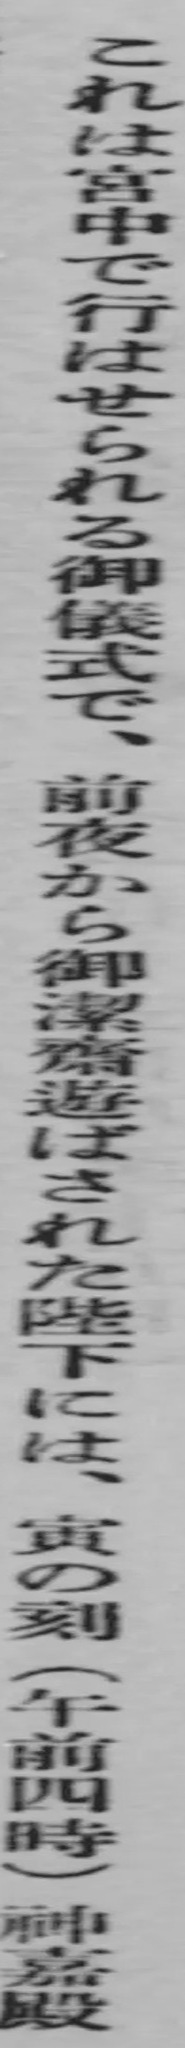これは宮中で行はせられる御儀式で、前夜から御潔齋遊ばされた陛下には、寅の刻(午前四時)神嘉殿
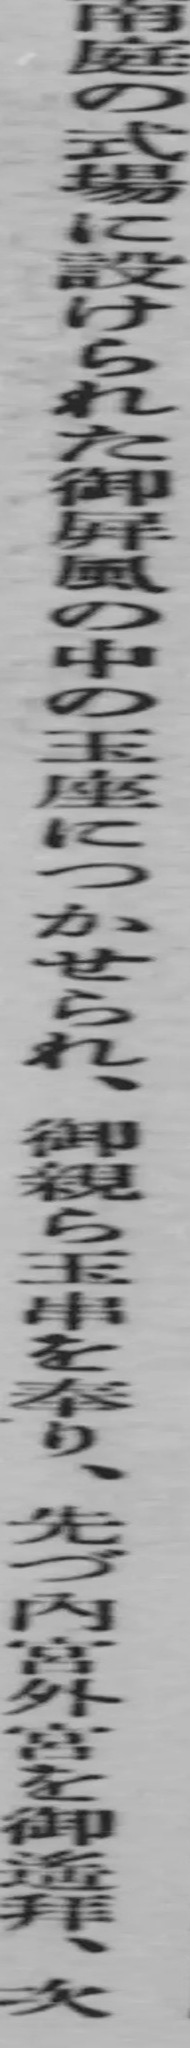南庭の式場に設けられた御屏風の中の玉座につかせられ、御親ら玉串を奉り、先づ内宮外宮を御遙拜、次
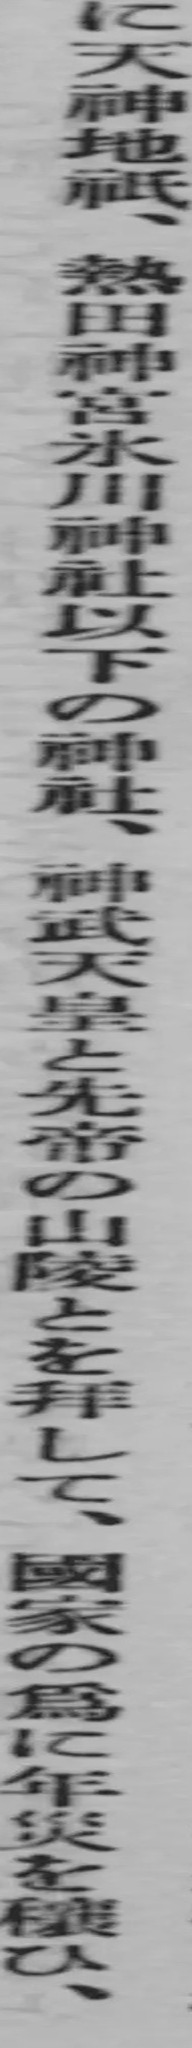に天神地祇、熱田神宮氷川神社以下の神社、神武天皇と先帝の山陵とを拜して、國家の爲に年災を穰ひ、
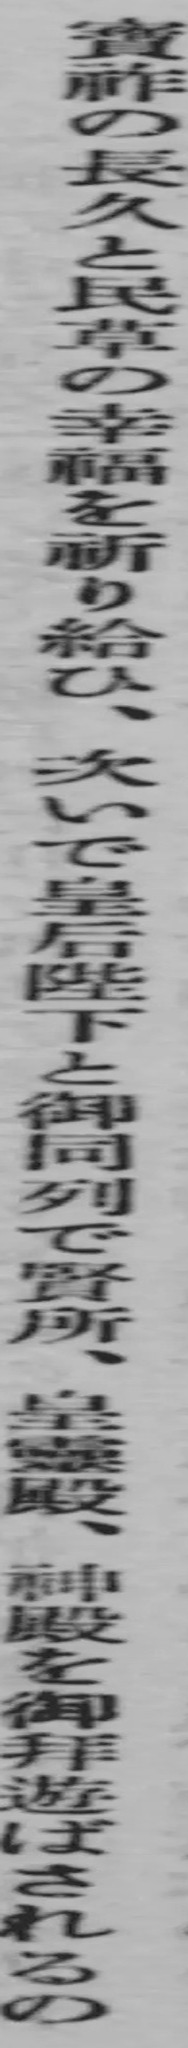寶祚の長久と民草の幸福を祈り給ひ、次いで皇后陛下と御同列で賢所、皇靈殿、神殿を御拜遊ばされるの
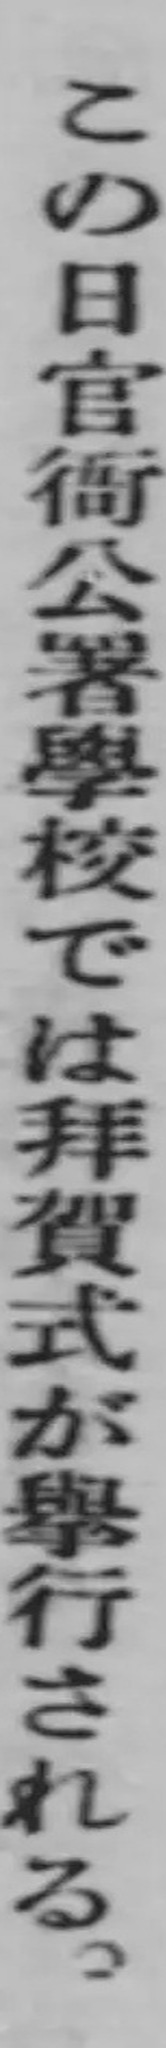この日官衙公署學校では拜賀式が擧行される。

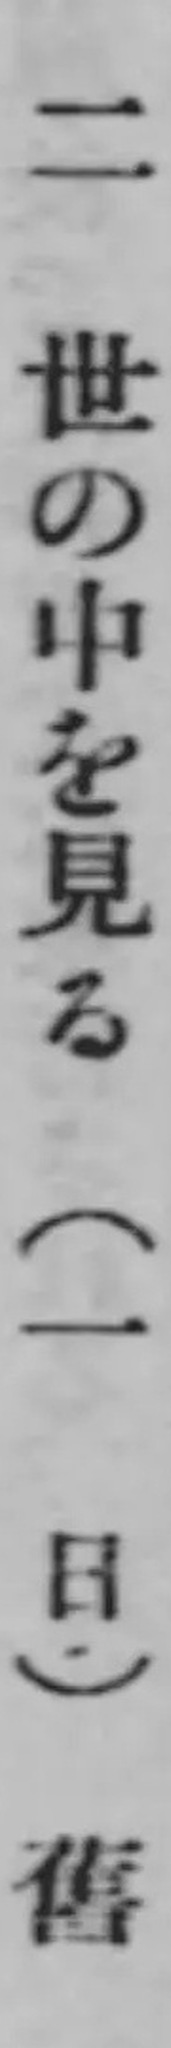二世の中を見る(一日)舊
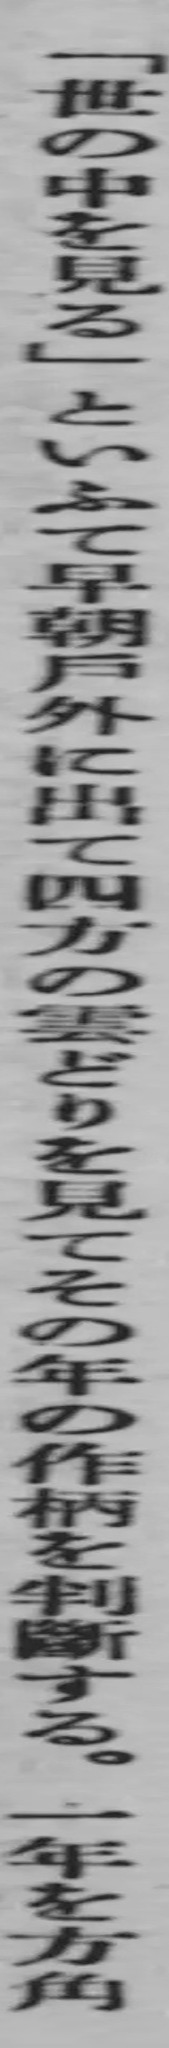「世の中を見る」といふて早朝戸外に出て四方の雲どりを見てその年の作柄を判斷する、一年を方角
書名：豊橋の年中行事
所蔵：国立国会図書館 National Diet Library, JAPAN
